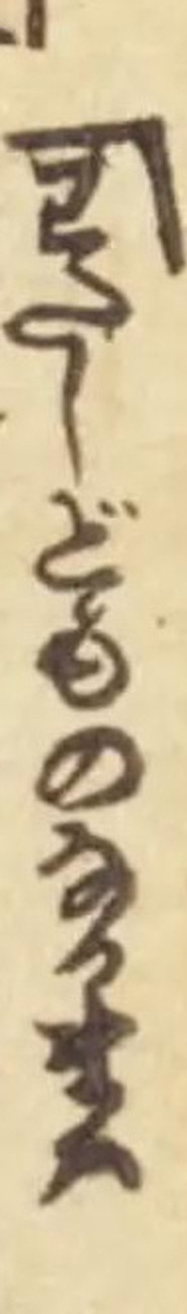「わたしどものなかまは
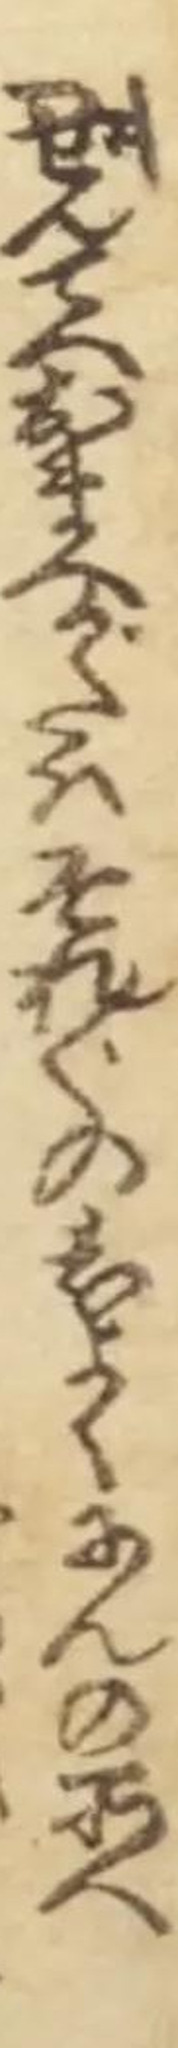「ぜんてへおまへがたはそれ〴〵のはよくにんの所へ
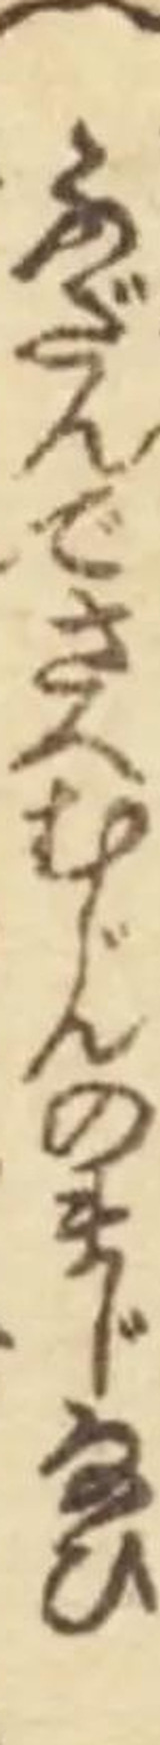ふだんでさへむじんのまじなひ
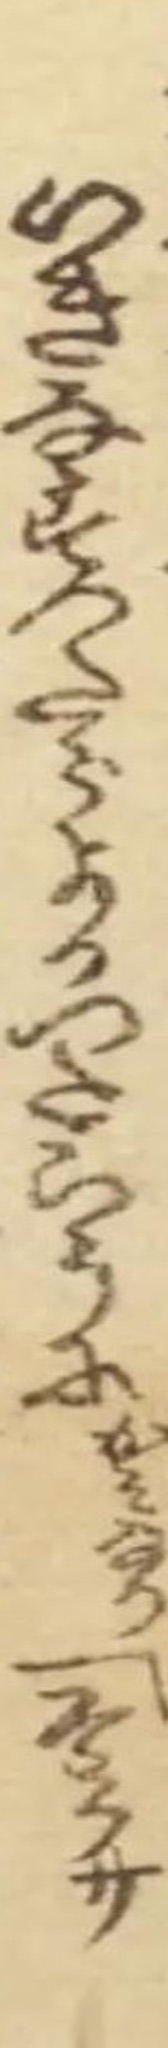いきなすつたらよかつたらうにかみなり「そうさ
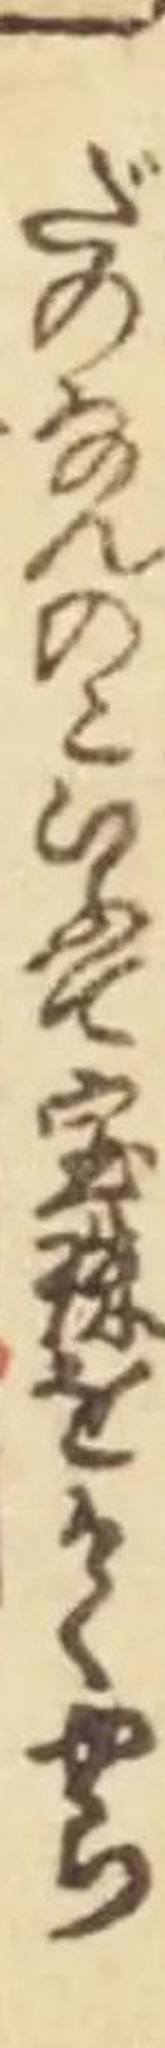だのなんのといふて宝珠をかくやら
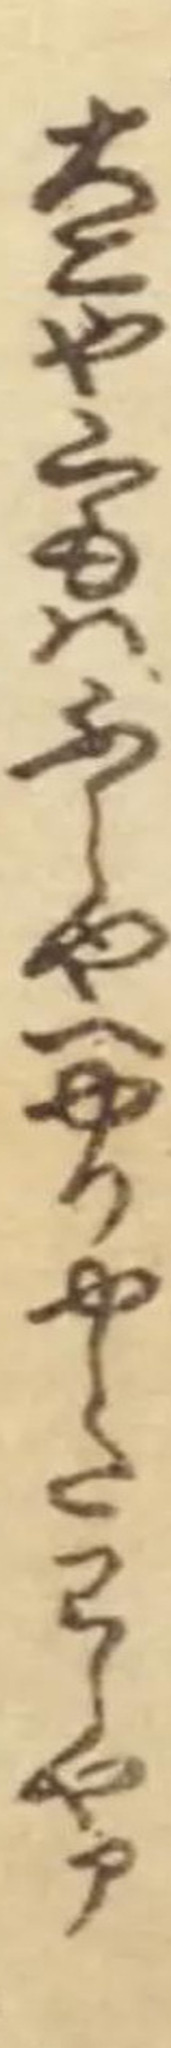大とやくもはふしやへやりやしたわしやア
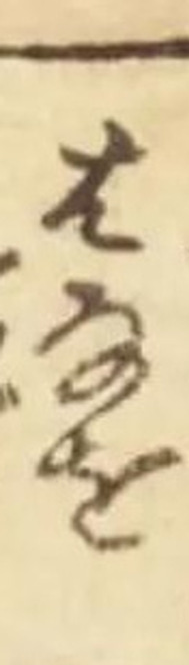はなを
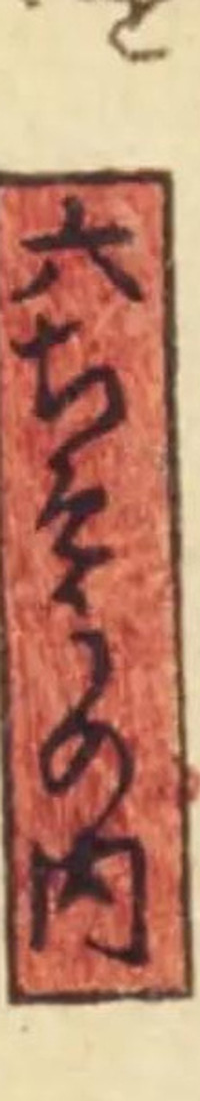六ちそうの内
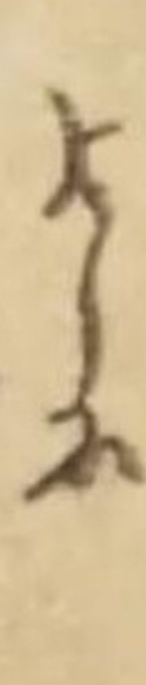よしに
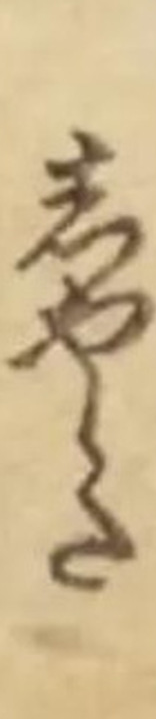しやした
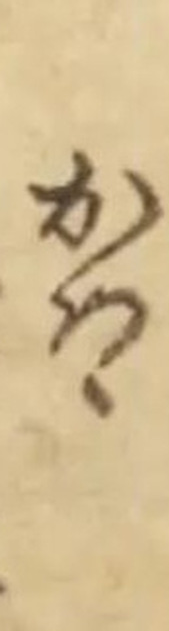かはゝ
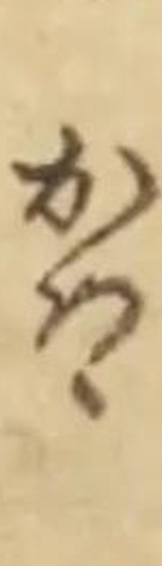かはゝ
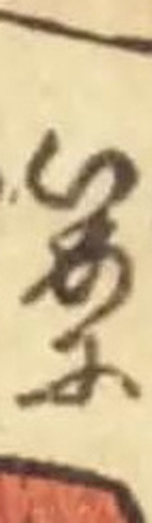いめに
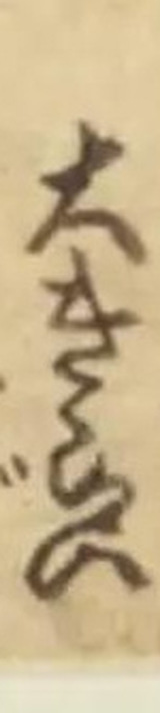大きらい
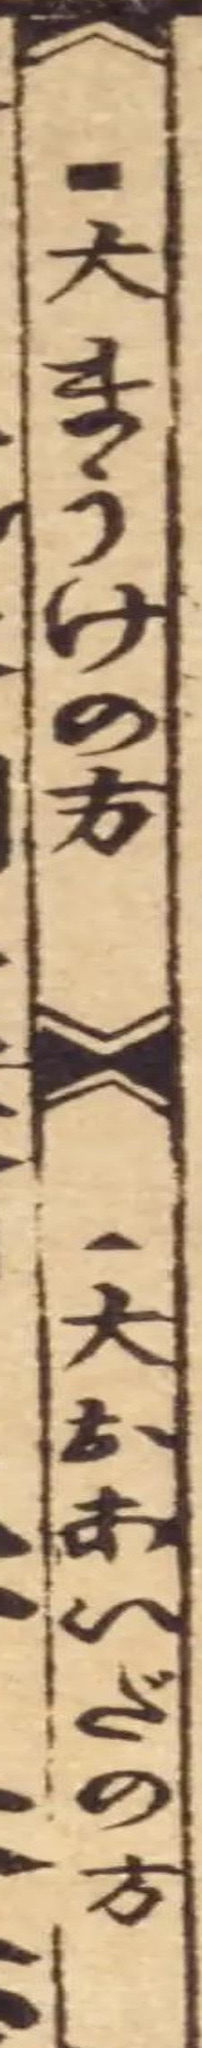●大まうけの方
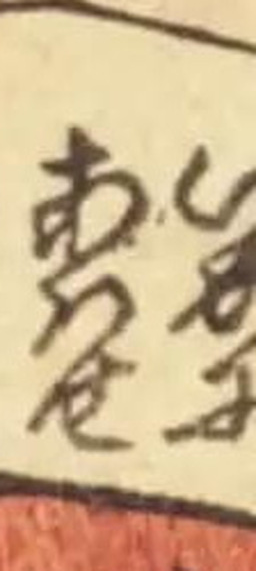あはせ
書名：安政二年十月二日地震出火後日角力
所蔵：国立国会図書館 National Diet Library, JAPAN
